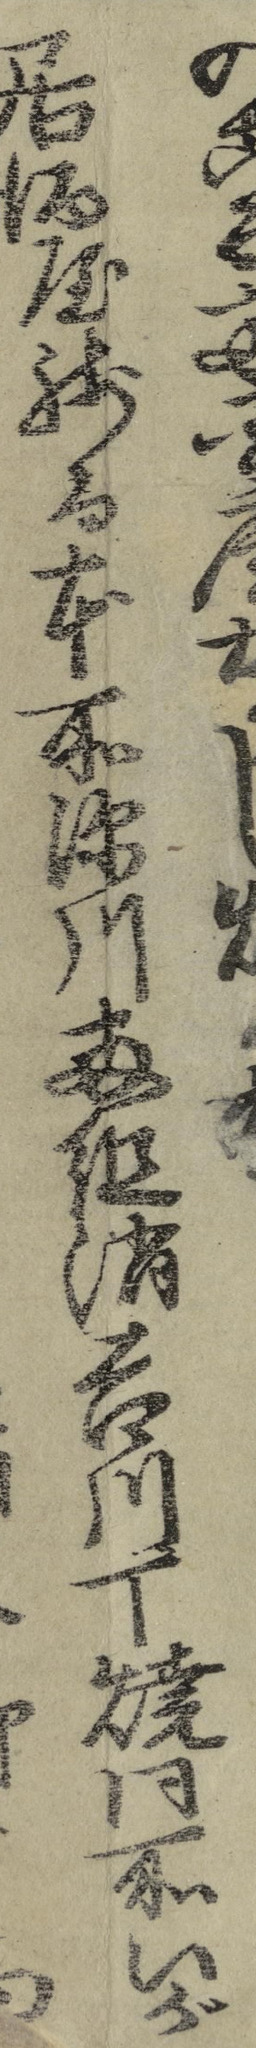居酒屋残る本所深川両組消吉川丁焼同所いが
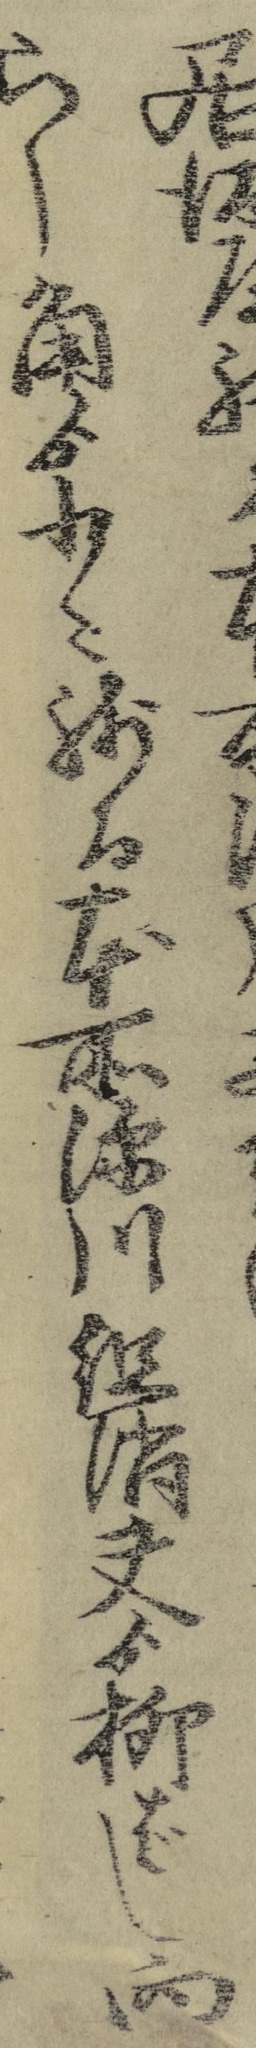らし角ゟ少々残る本所深川組消夫ゟ柳ばし向
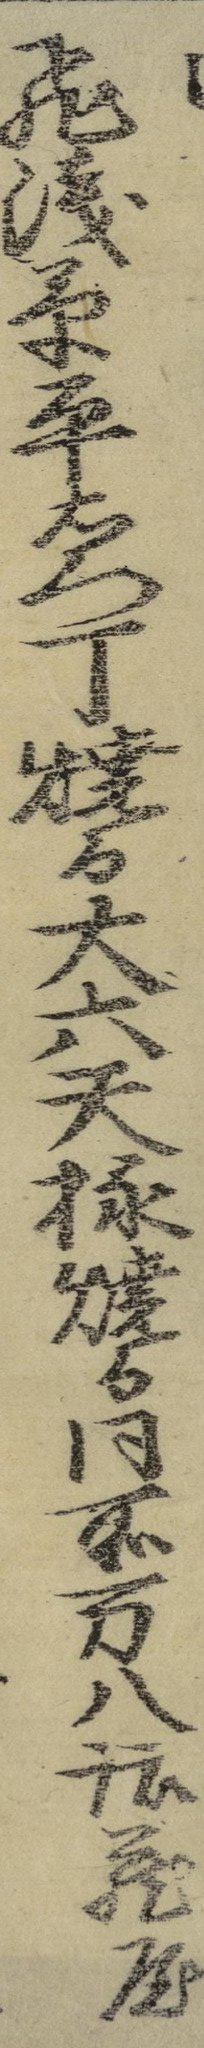ひ浅草平右衛門丁焼る大六天様焼る同所万八諸蔵屋
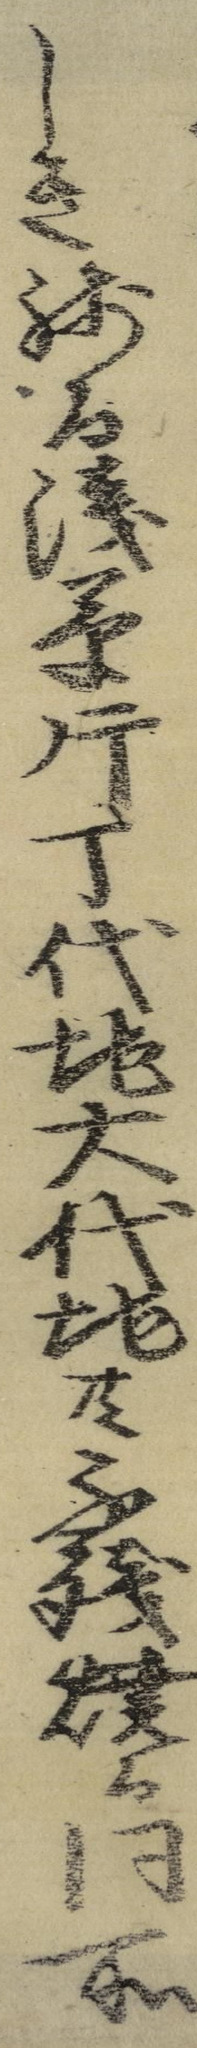しき残る浅草片丁代地大代地共不残焼る同所
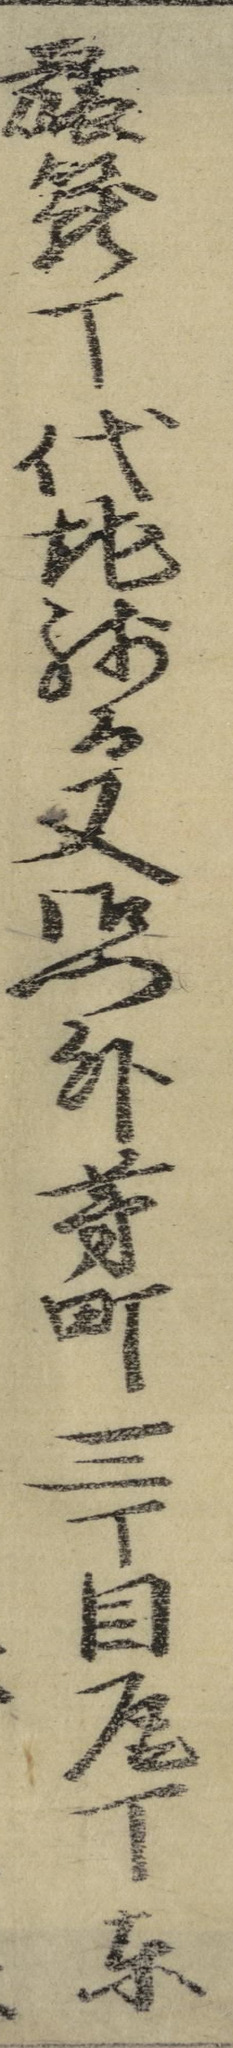旅籠丁代地残る又御門外茅町一二丁目瓦丁東
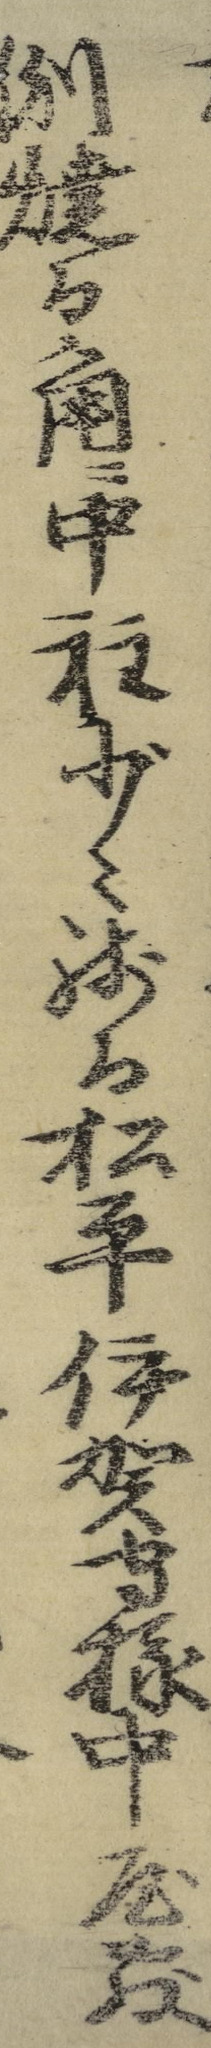側焼る角に中程少々残る松平伊賀守様中屋敷
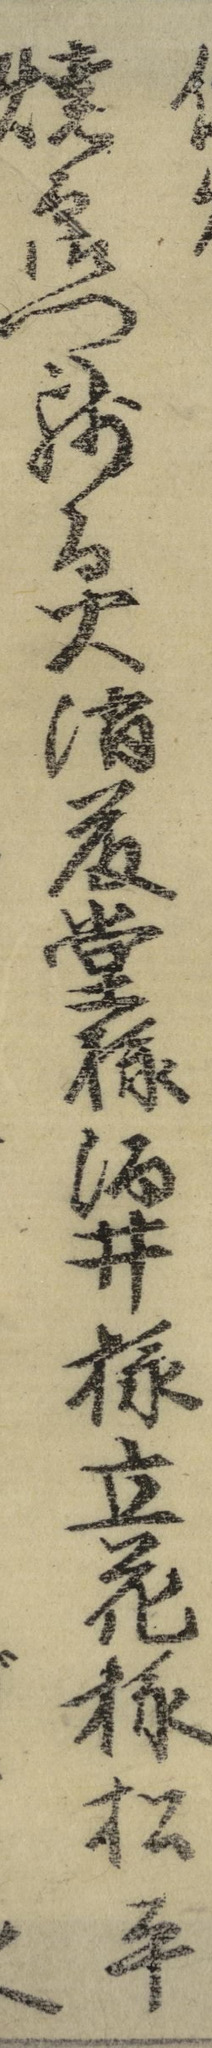焼る御門残る火消藤堂様酒井様立花様松平
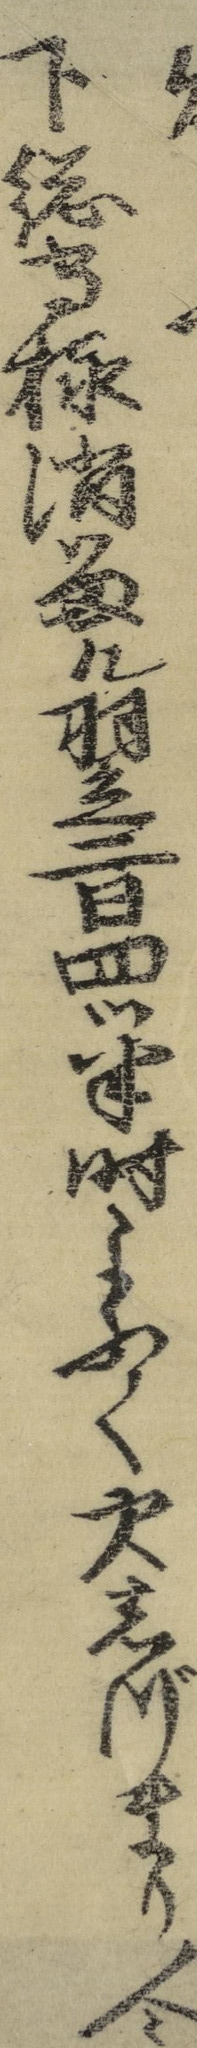下総守様消留ル翌二日四ツ半時よふ〳〵火しづまり人々
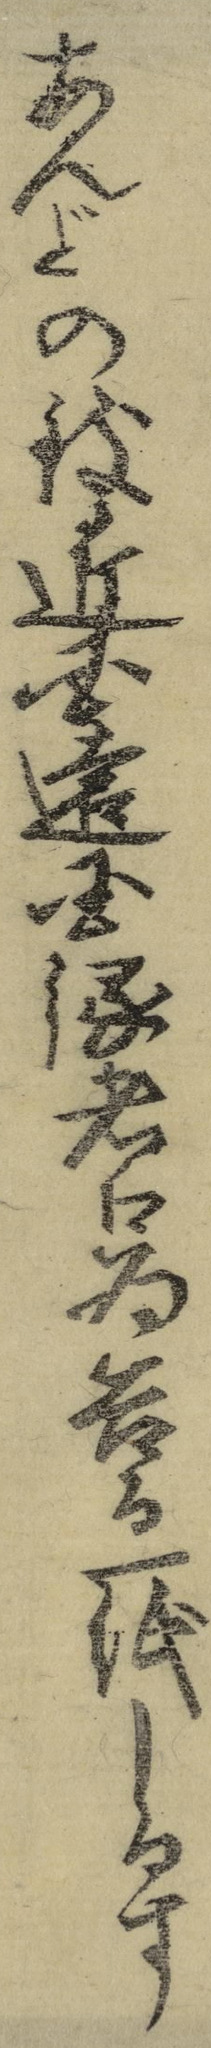あんどの致近国遠国縁者え為告る一紙しるす
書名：[安政二年三月の江戸大火に関する瓦版]
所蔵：東京大学地震研究所図書室 Earthquake Research Institute Library, The University of Tokyo, JAPAN
